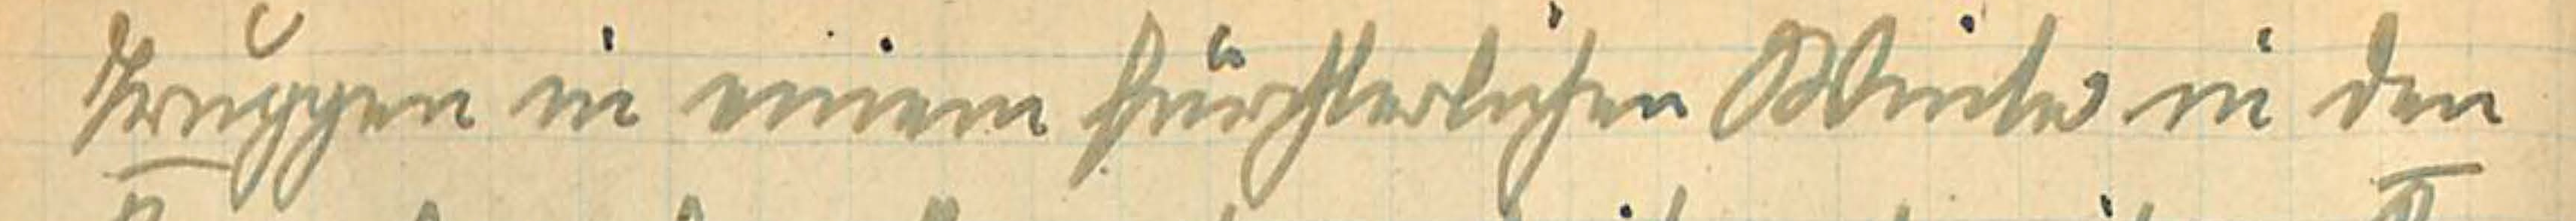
Truppen in einem fürchterlichen Winter in den
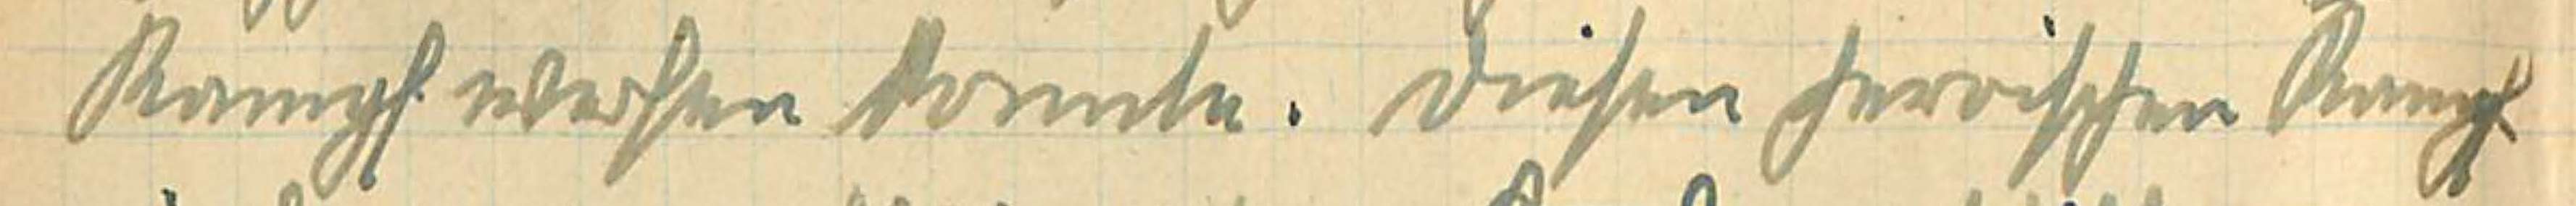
Kampf werfen konnte. Diesen heroischen Kampf
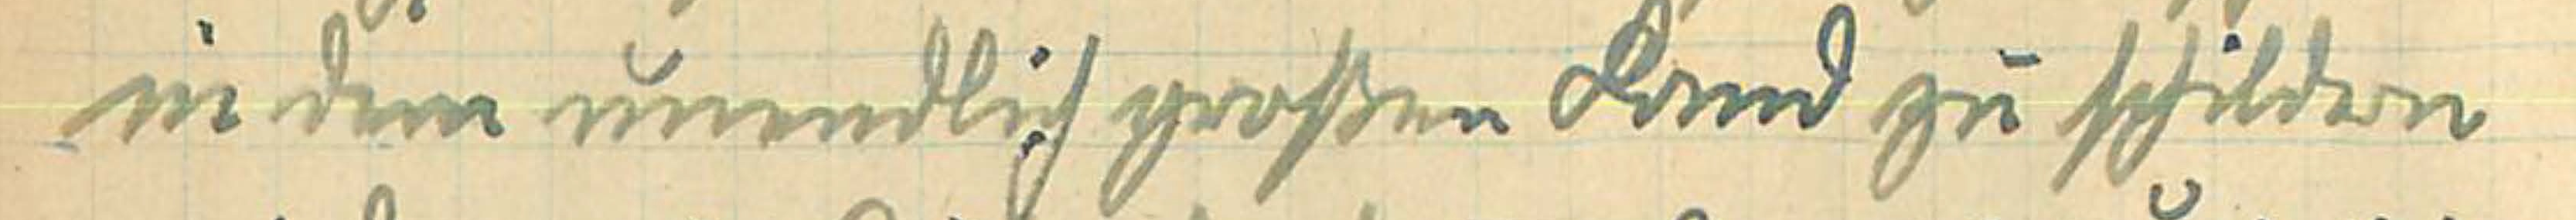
in dem unendlich großen Land zu schildern
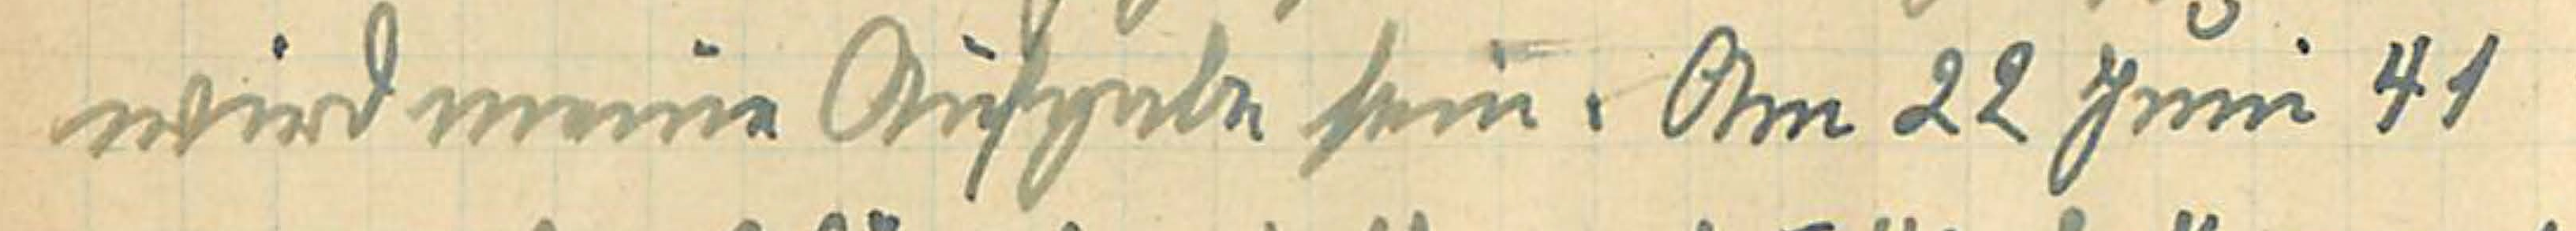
wird meine Aufgabe sein. Am 22 Juni 41
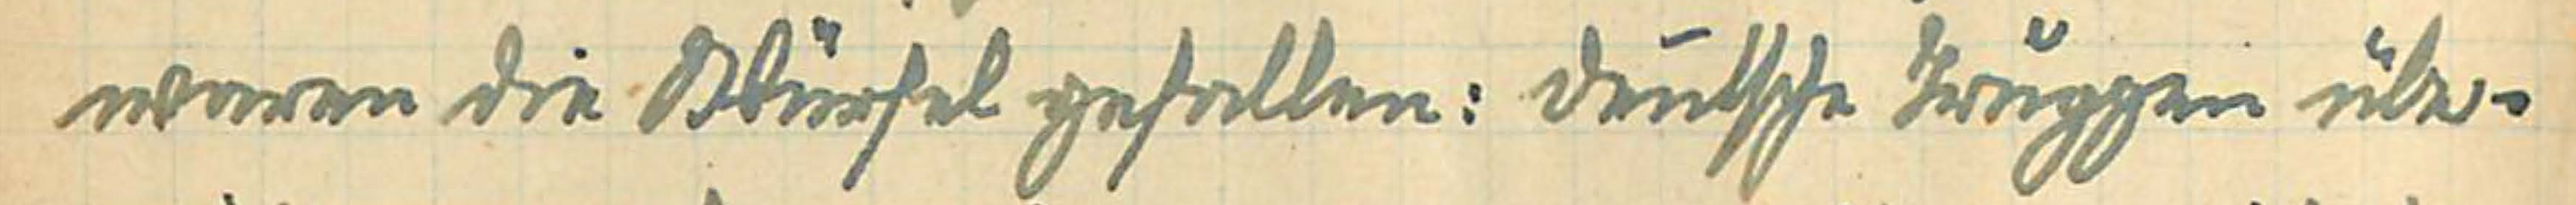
waren die Würfel gefallen: deutsche Truppen über-
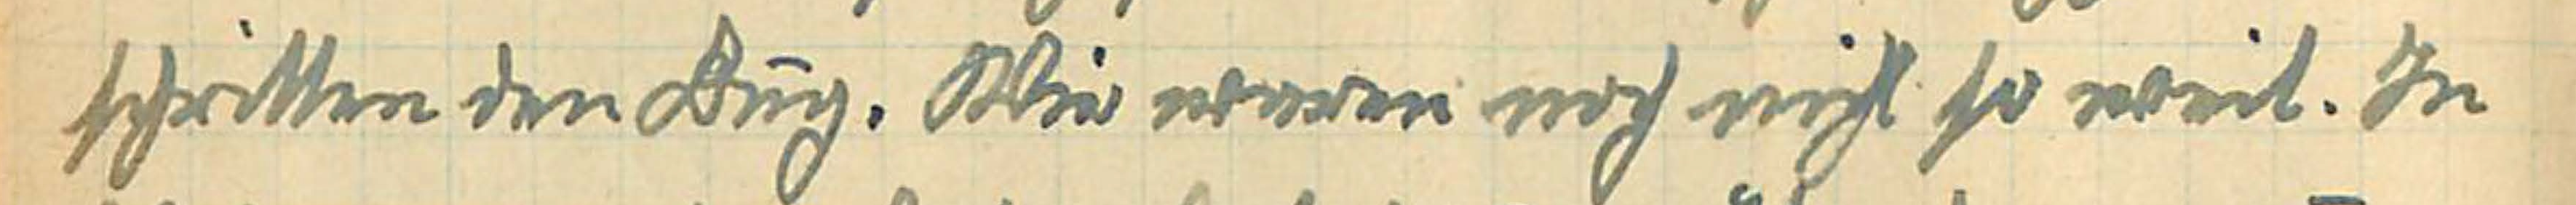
schritten den Bug. Wir waren noch nicht so weit. In
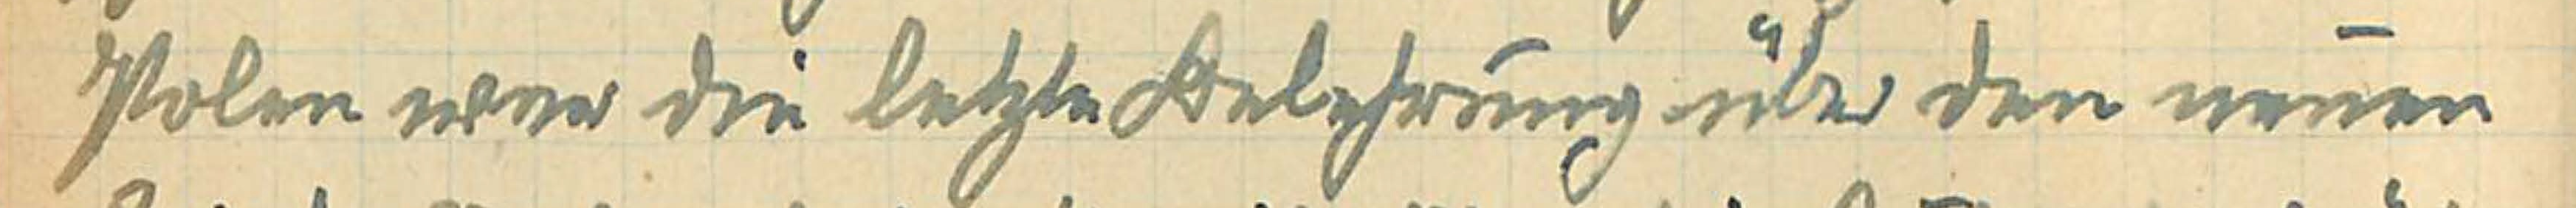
Polen war die letzte Belehrung über den neuen
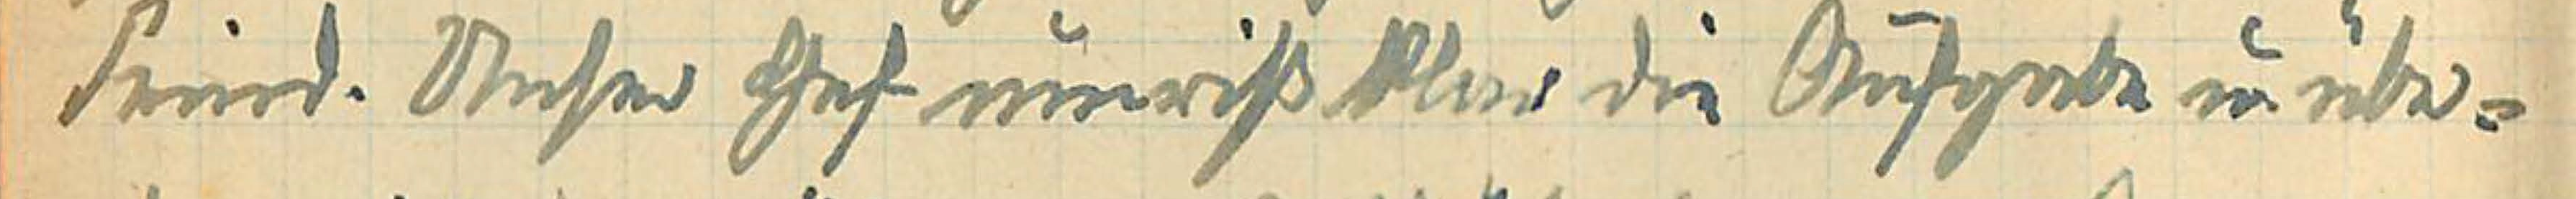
Feind. Unser Chef umriß klar die Aufgabe u. über-
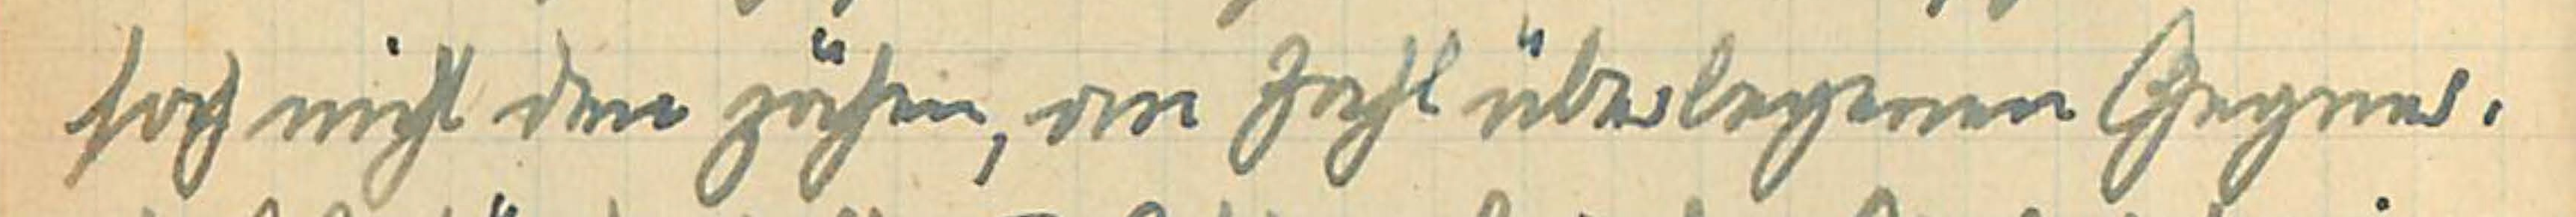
sah nicht den zähen, an Zahl überlegenen Gegner.
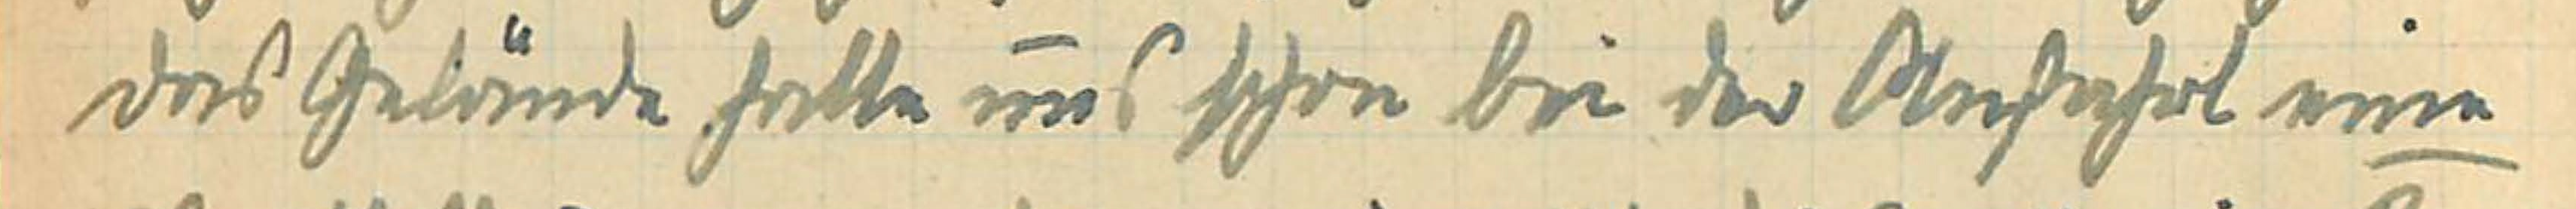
Das Gelände hatte uns schon bei der Anfahrt eine
